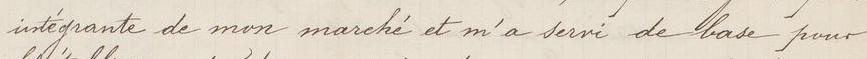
intégrante de mon marché et m'a servi de base pour
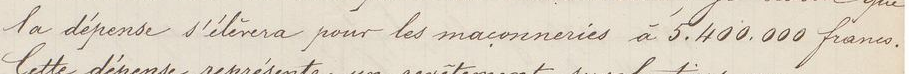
la dépense s'élèvera pour les maçonneries à 5.400.000 francs.
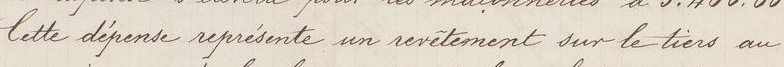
Cette dépense représente un revêtement sur le tiers au
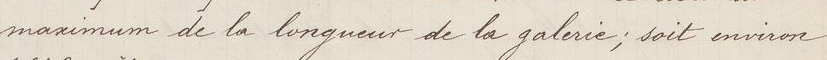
maximum de la longueur de la galerie, soit environ
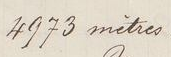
4973 mètres.
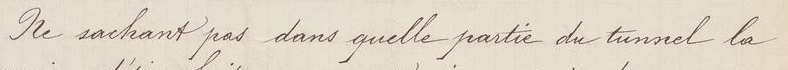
Ne sachant pas dans quelle partie du tunnel la
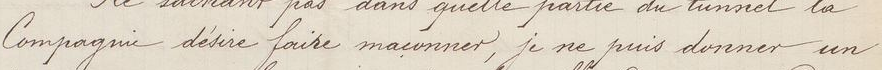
Compagnie désire faire maçonner, je ne puis donner un
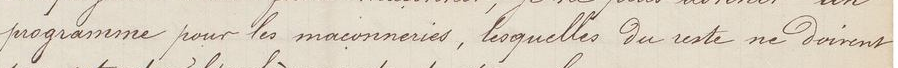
programme pour les maçonneries, lesquelles du reste ne doivent
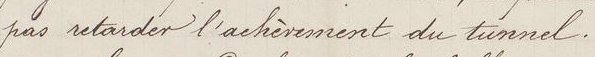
pas retarder l'achèvement du tunnel.
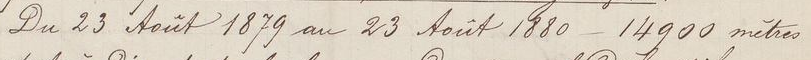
Du 23 Août 1879 au 23 Août 1880 – 14900 mètres
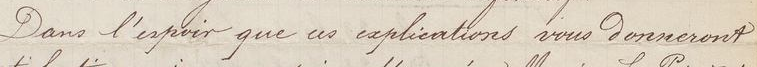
Dans l'espoir que ces explications vous donneront
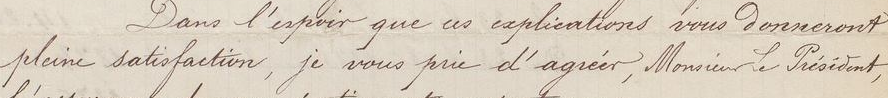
pleine satisfaction, je vous prie d'agréer, Monsieur Le Président,
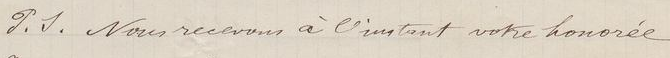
P. S. Nous recevons à l'instant votre honorée
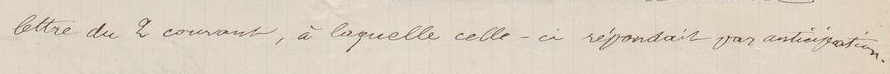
lettre du 2 courant, à laquelle celle-ci répondait par anticipation.
